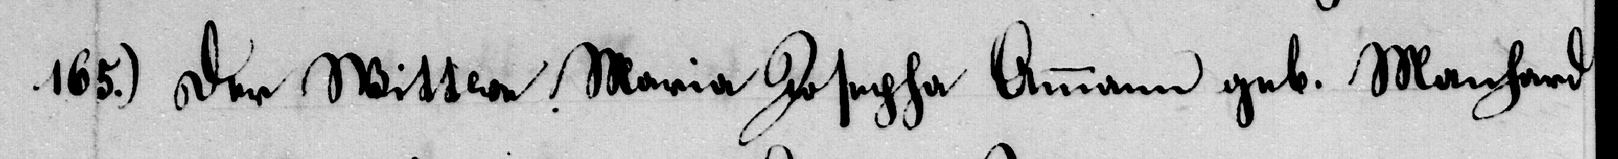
165.) Der Wittwe Maria Josepha Ammann geb. Manhard
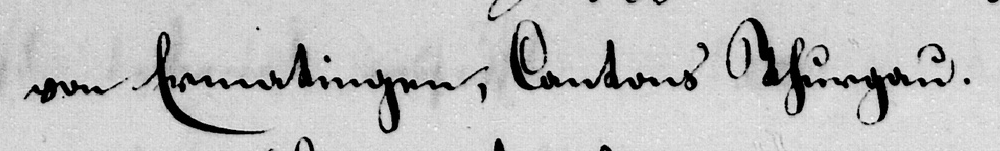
von Ermatingen, Cantons Thurgau.
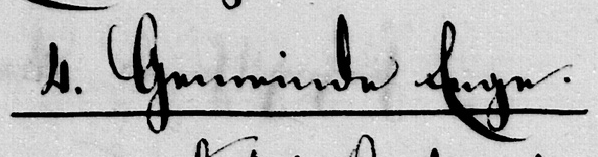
4. Gemeinde Enge.
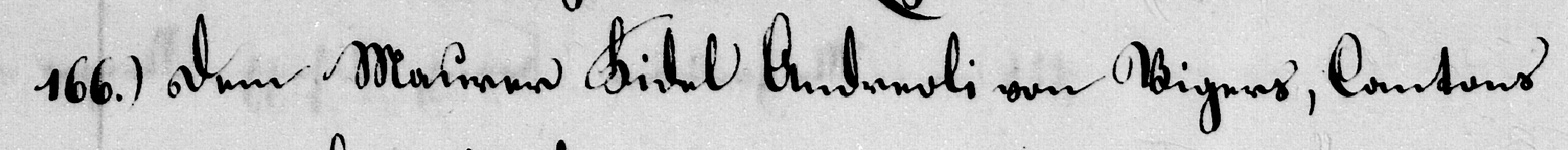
166.) Dem Maurer Fidel Andreoli von Vigers, Cantons
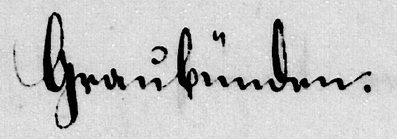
Graubünden.
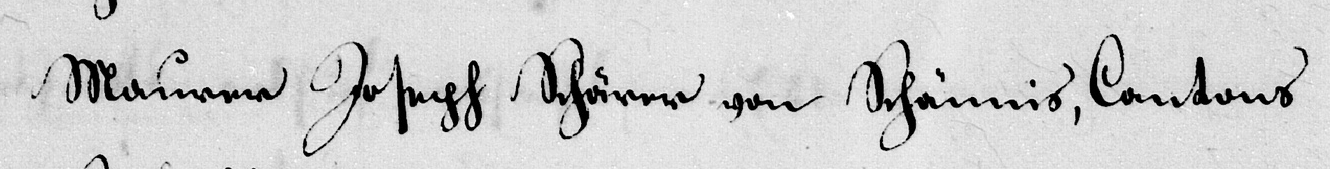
Maurer Joseph Schärer von Schännis, Cantons
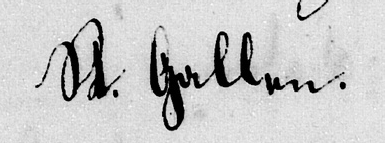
St. Gallen.
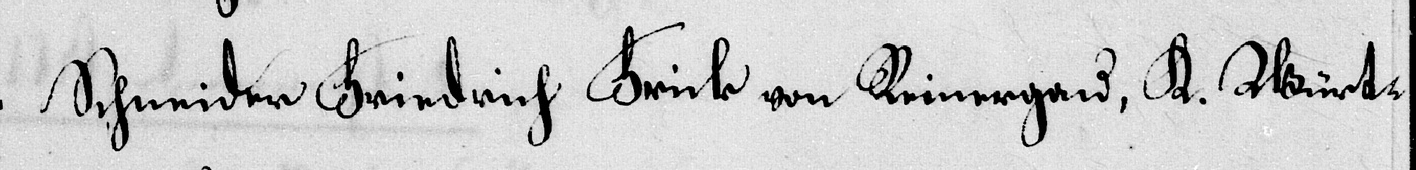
Schneider Friedrich Frick von Reinergau, K. Würt¬
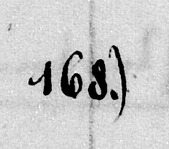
168.)
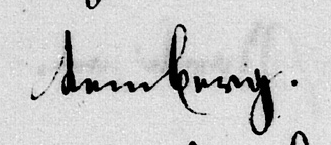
temberg.
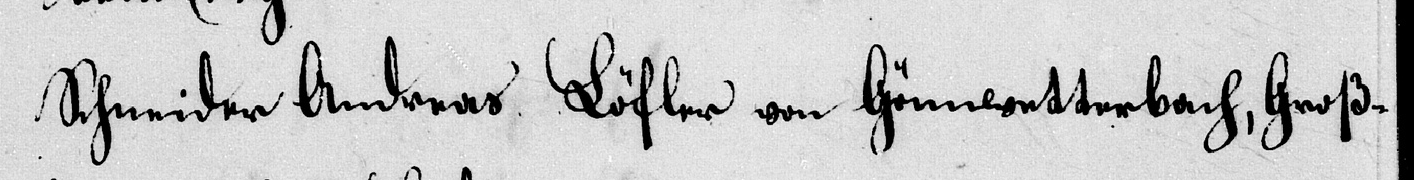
Schneider Andreas Löfler von Gönnwetterbach, Groß¬
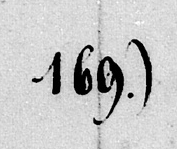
169.)
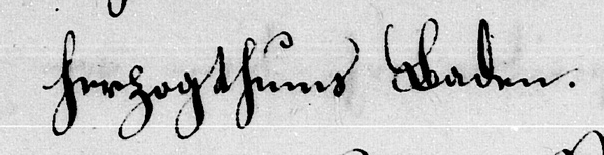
herzogthums Baden.
